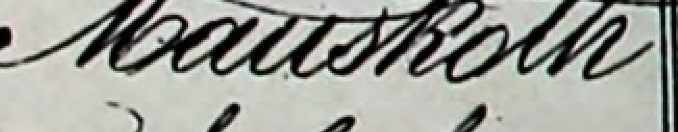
Mauskoth
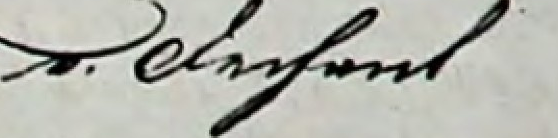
v. Dechenl
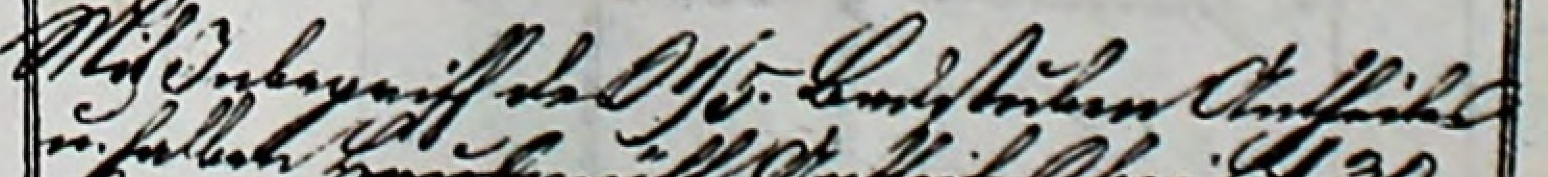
Mit Inbegriff des 95. Badstuben Antheiles
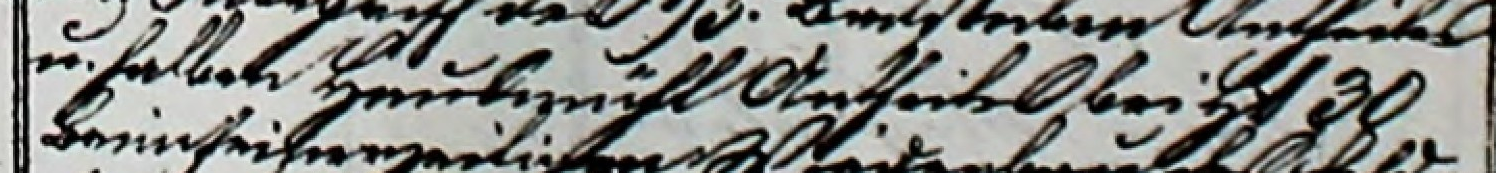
u. halben Hauszucht Antheiles bei H? 30
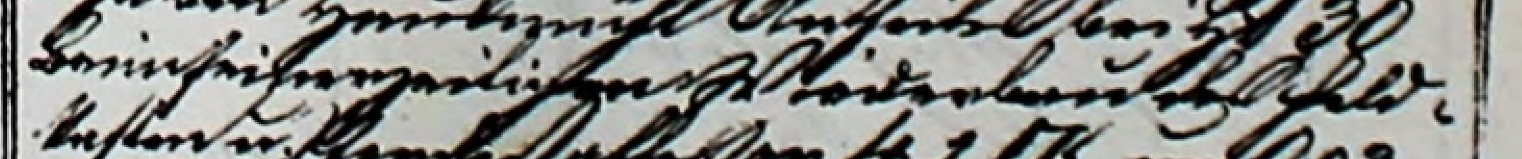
Beim seinerzeilichen Wiederbau des Hold„
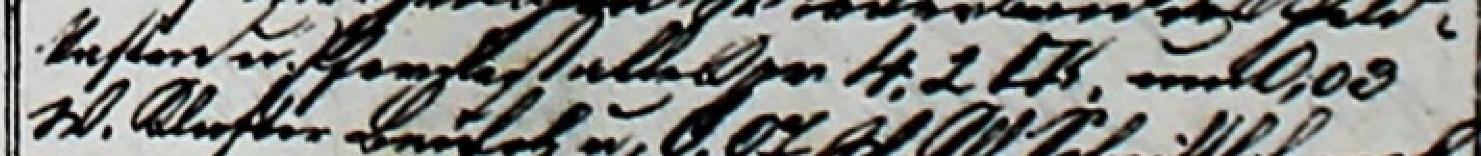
kasten u. Pferglast altes pr 4.2 Ck, um 0,03
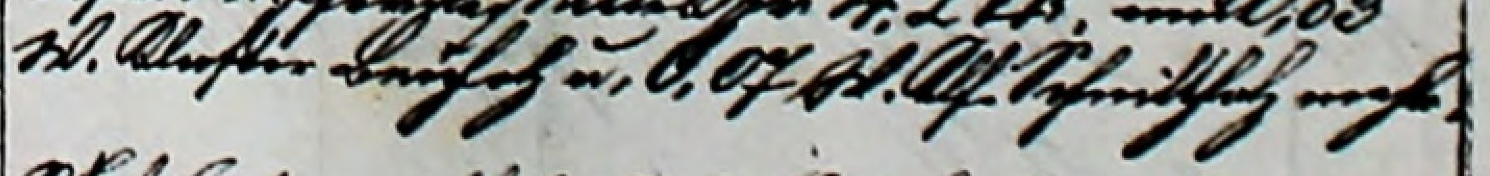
W. Klafter Bauholz u. 0,07 W. Ath. Schnittholz mehr.
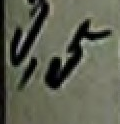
3,5
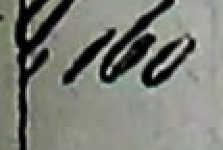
0,160
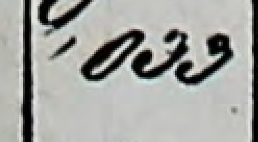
0,033
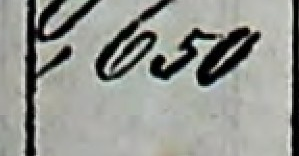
0,650
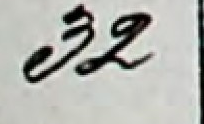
32
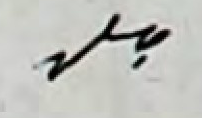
do
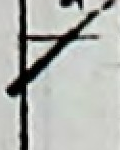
7
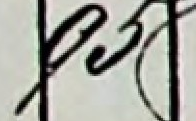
95
